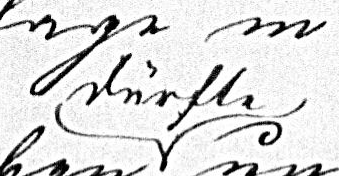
dürfte
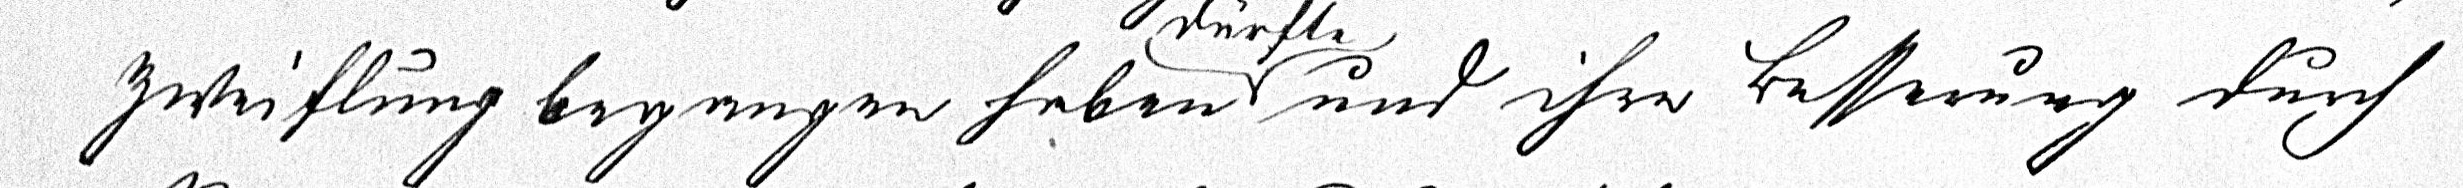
zweiflung begangen haben und ihre Besserung durch
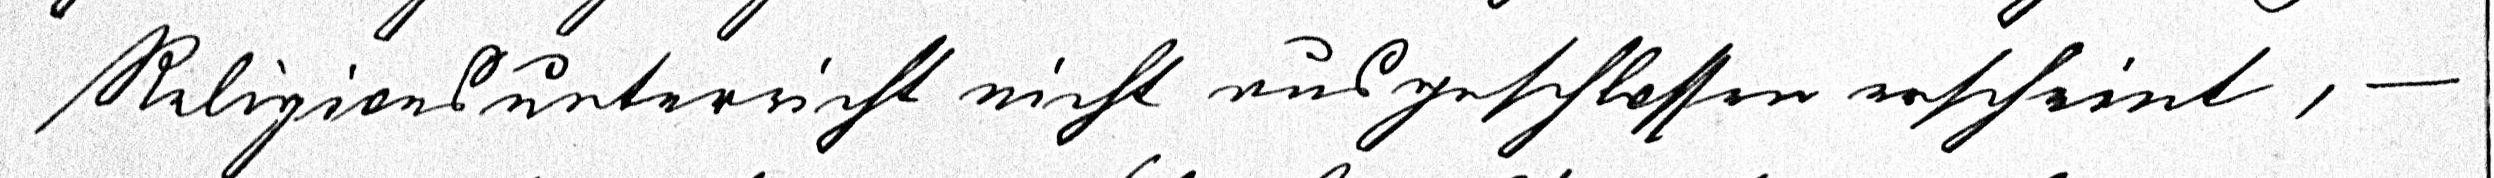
Religionsunterricht nicht ausgeschlossen erscheint, —
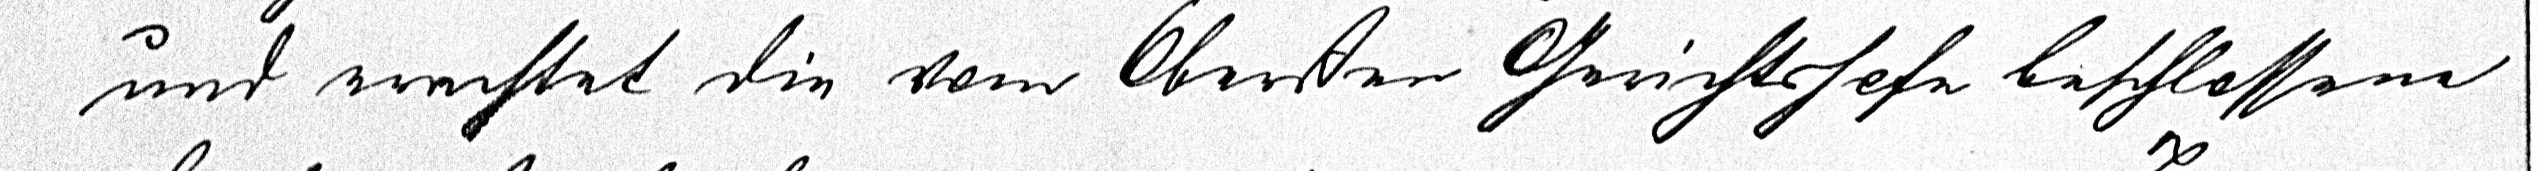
und erachtet die vom Obersten Gerichtshofe beschlossene
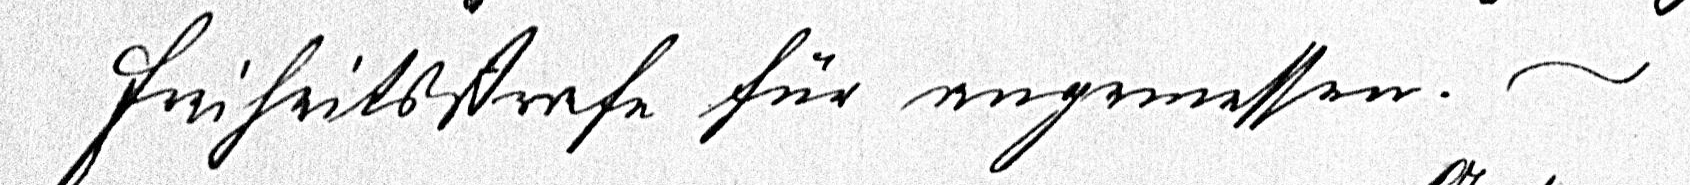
Freiheitsstrafe für angemessen.
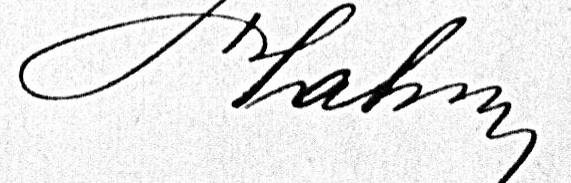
xx
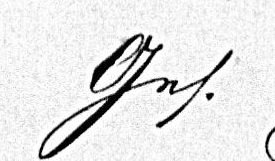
Ges.
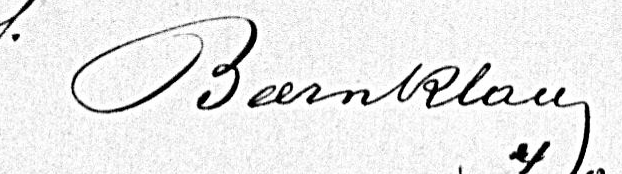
Barnklau
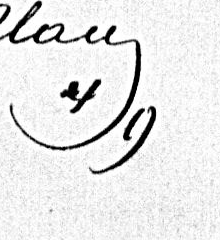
4/9
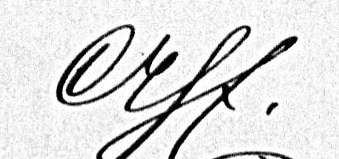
AhE.
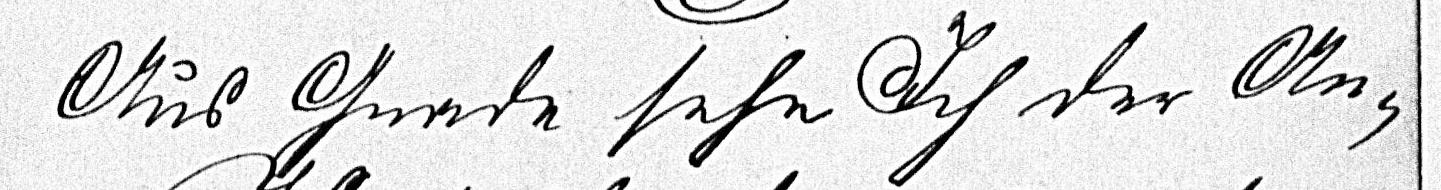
Aus Gnade sehe Ich der An¬
